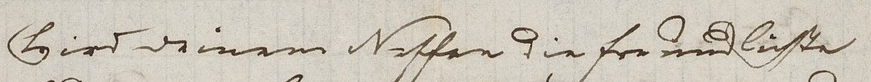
wird Deinem Neffen die freundlichste
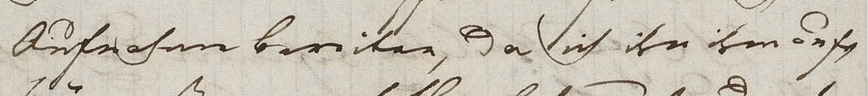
Aufnahme bereiten, da ich ihn ihm aufs
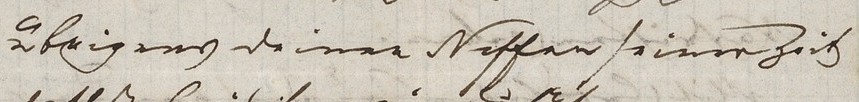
übrigens Deinen Neffen seiner Zeit
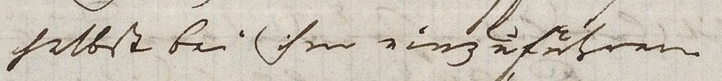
selbst bei ihm einzuführen.
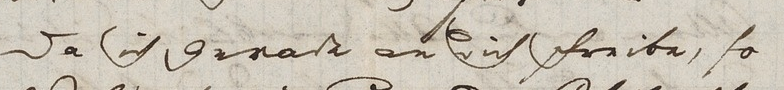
Da ich gerade an dich schreibe, so
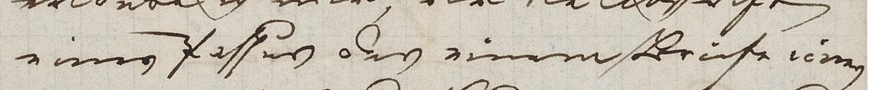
eines Passus aus einem Briefe eines
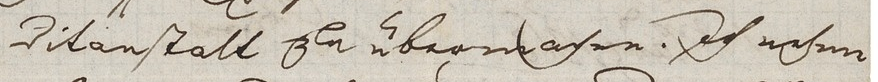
ditanstalt zu übermachen. Ich nehme
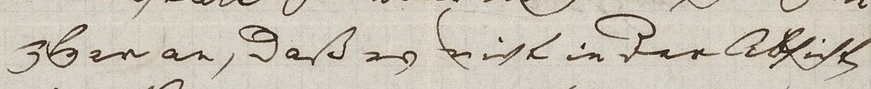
zwar an, daß es nicht in der Absicht
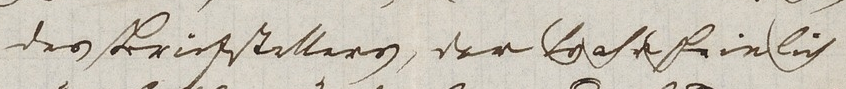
des Briefstellers, der wahrscheinlich
